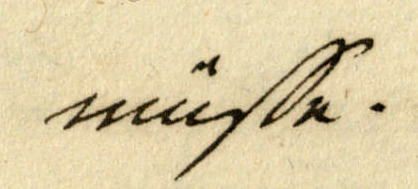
müsse.
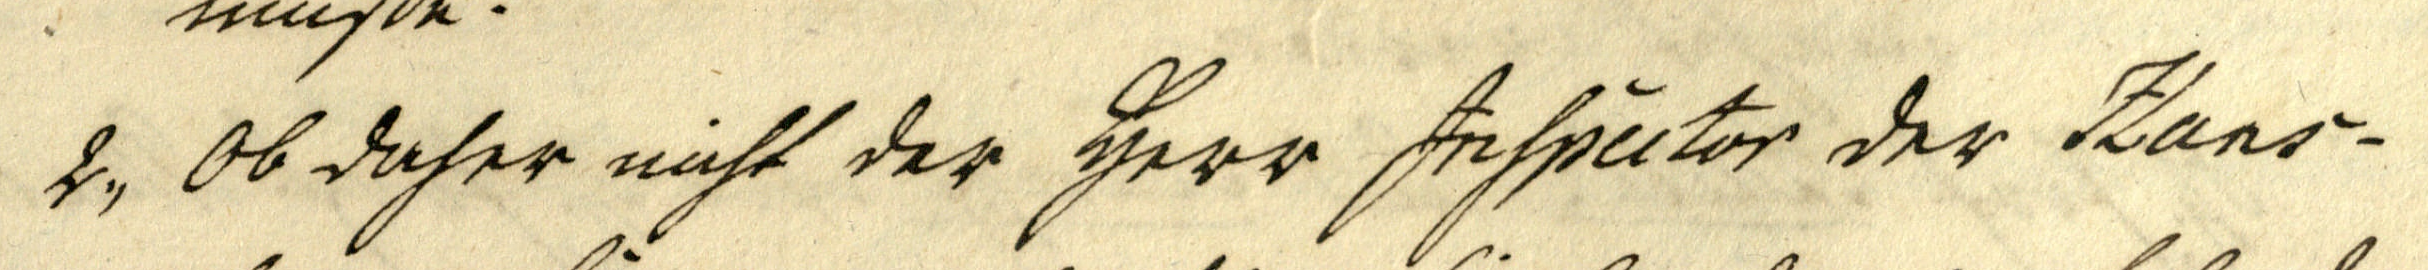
2., Ob daher nicht der Herr Inspector der Hans-
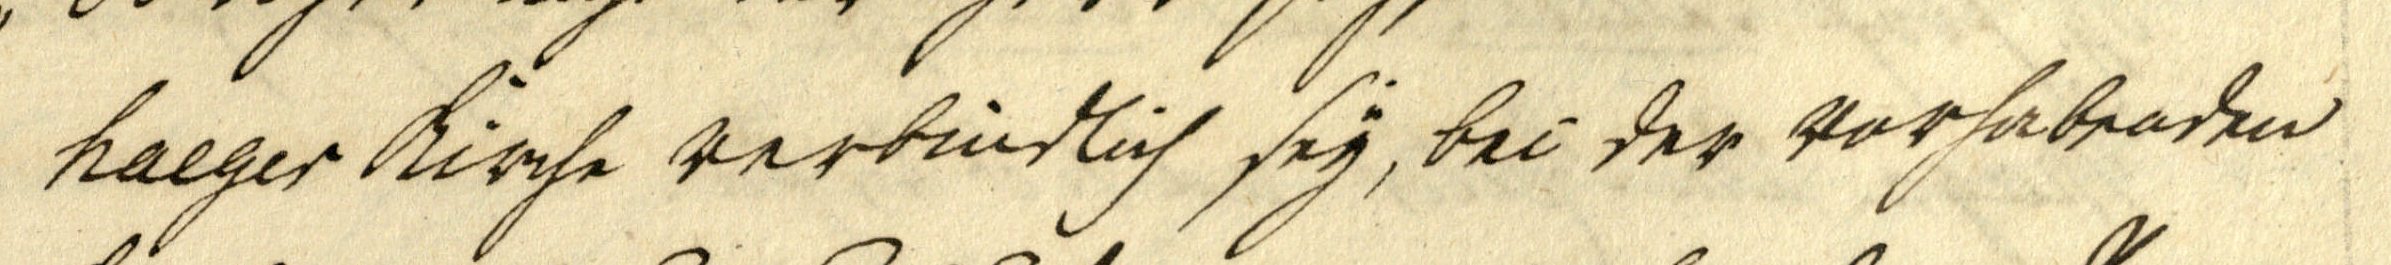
haeger Kriche verbindlich sey, bei der vorhabenden
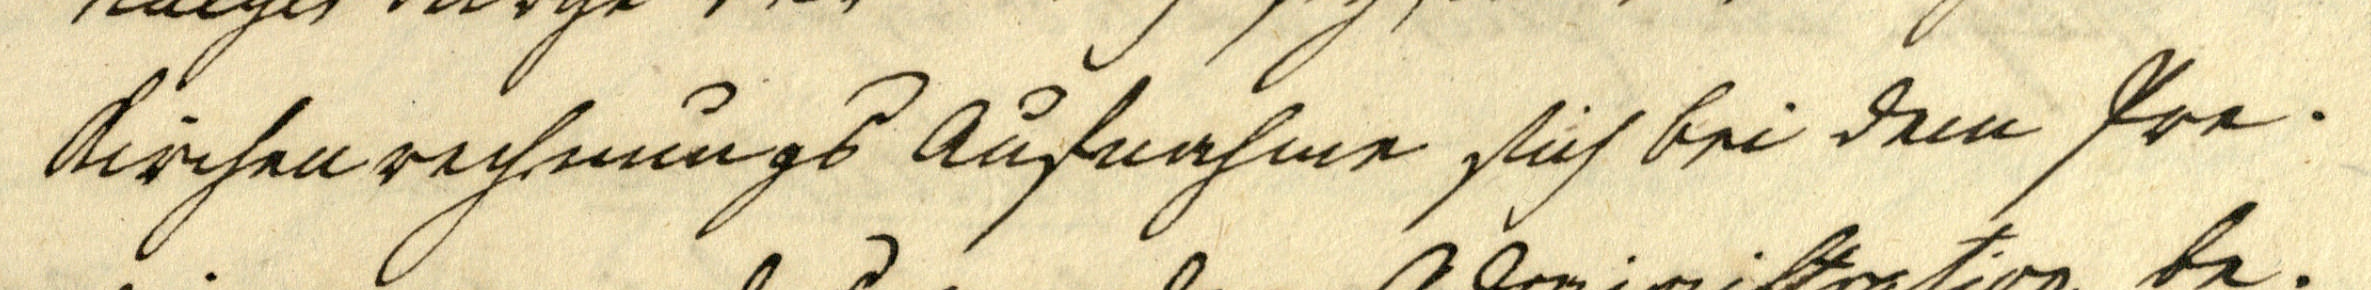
Kirchenrechnungs Aufnahme sich bei dem Pre-
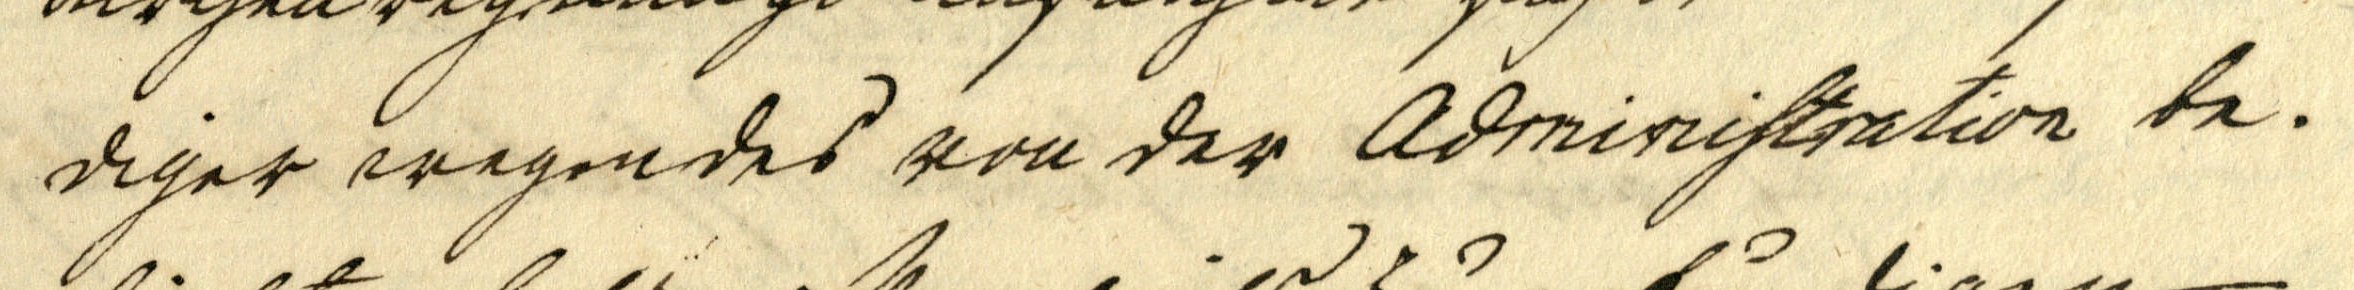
diger wegen des von der Administration be-
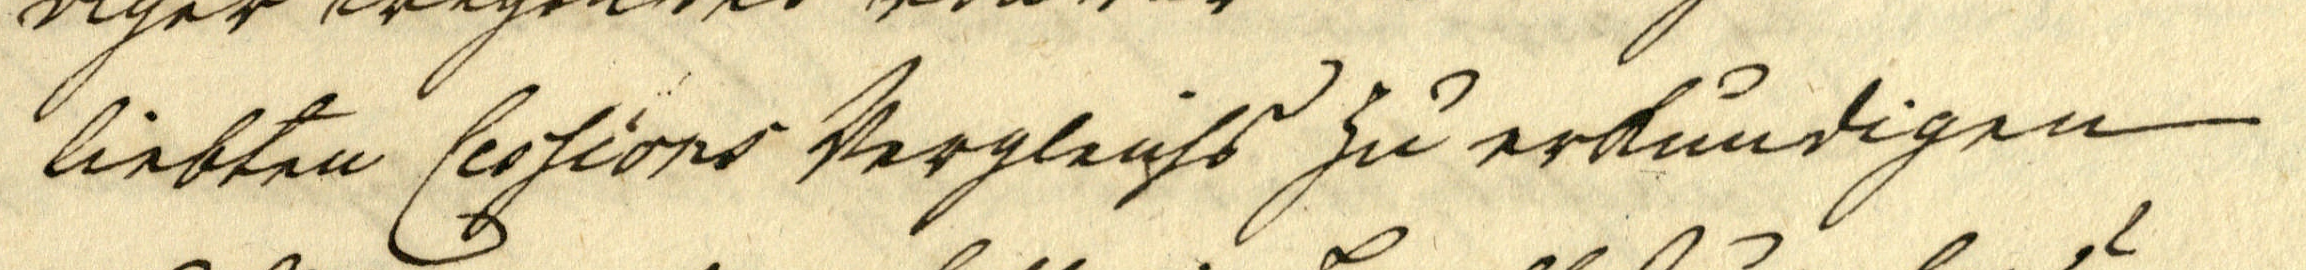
liebten Cessions Vergleichs zu erkundigen
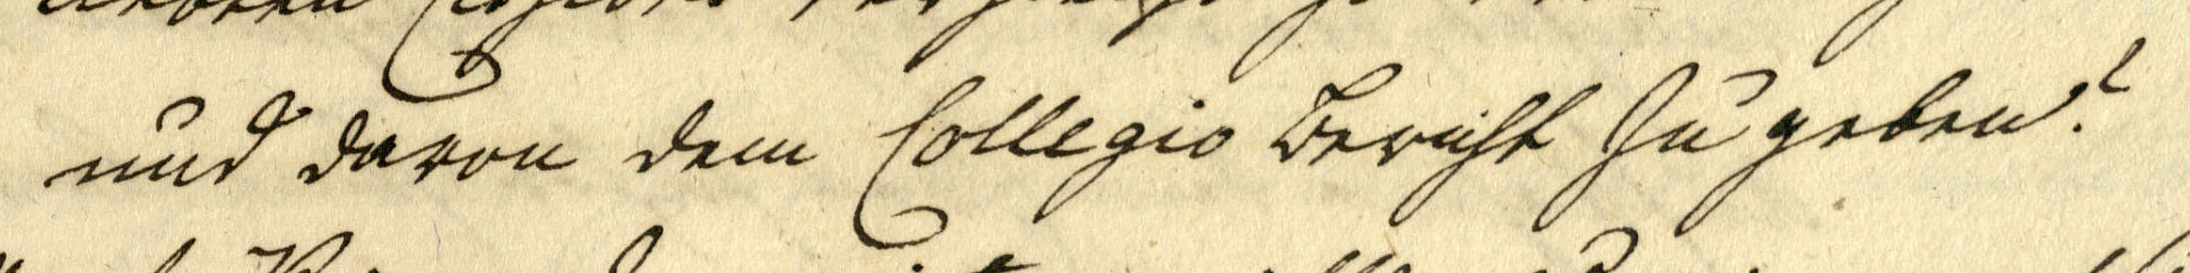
und davon dem Collegio Bericht zu geben?
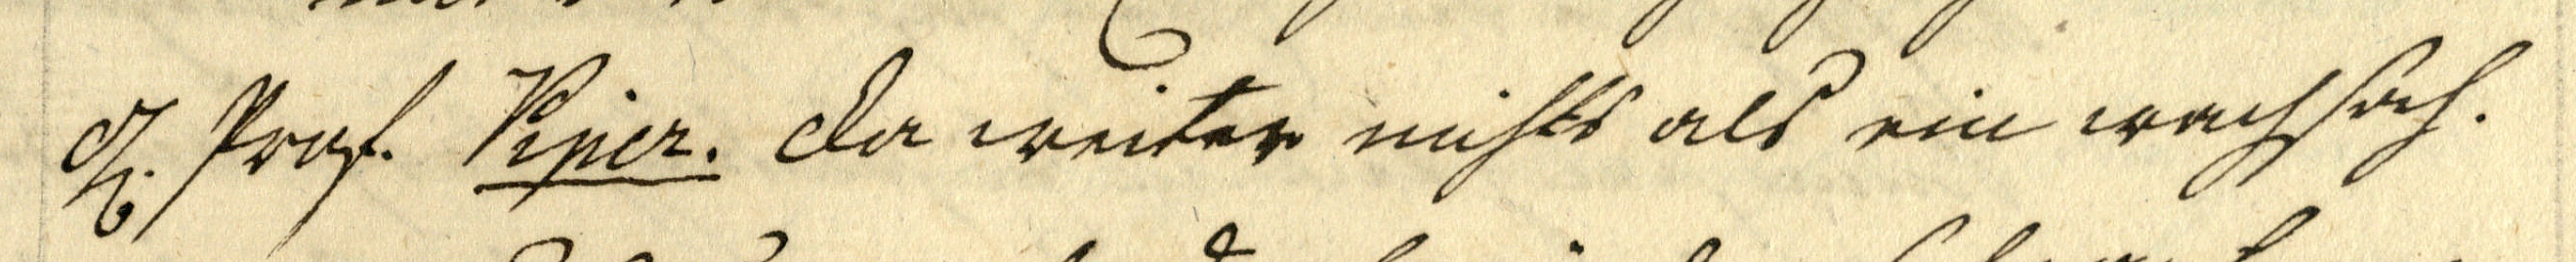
dh. Prof. Piper. Da weiter nichts als ein wachsah-
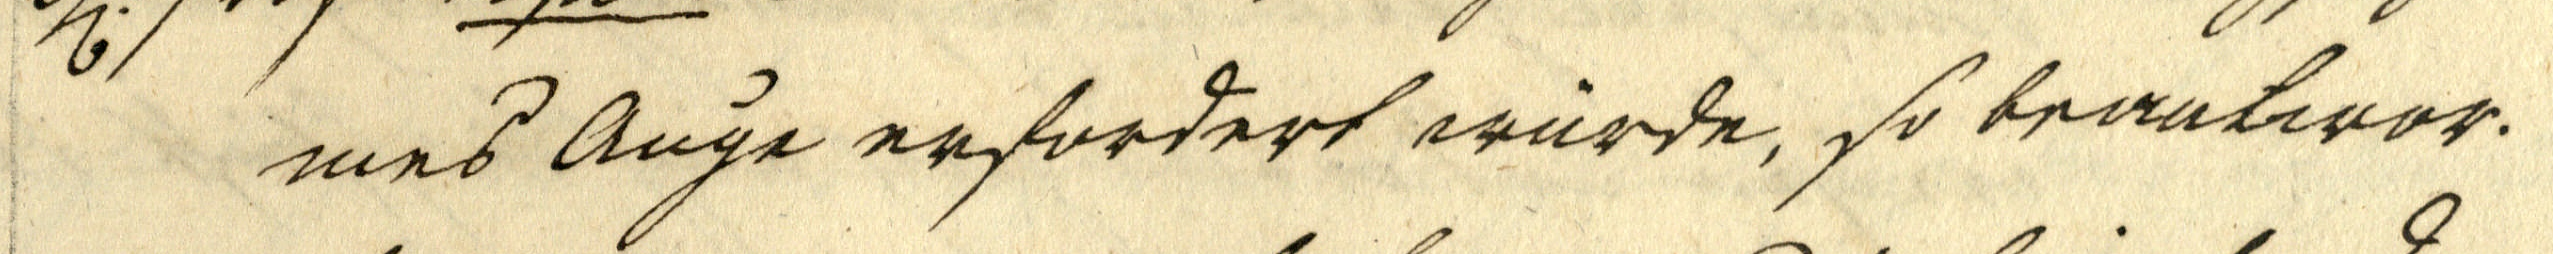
mes Auge erfordert würde, so beantwor-
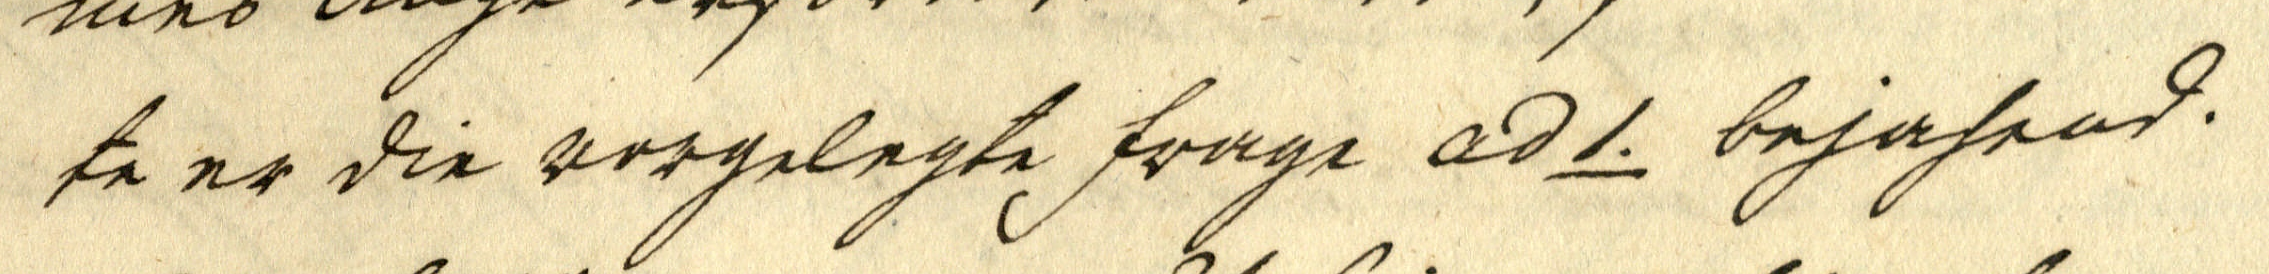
te er die vorgelegte Frage ad 1. bejahend.
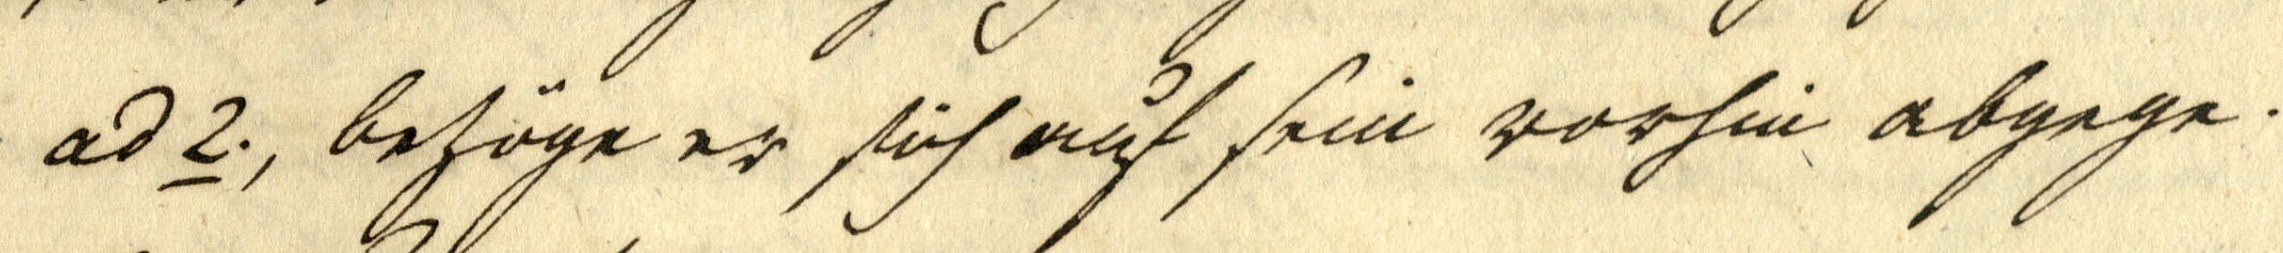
ad 2., bezöge er sich auf sein vorhin abgege-
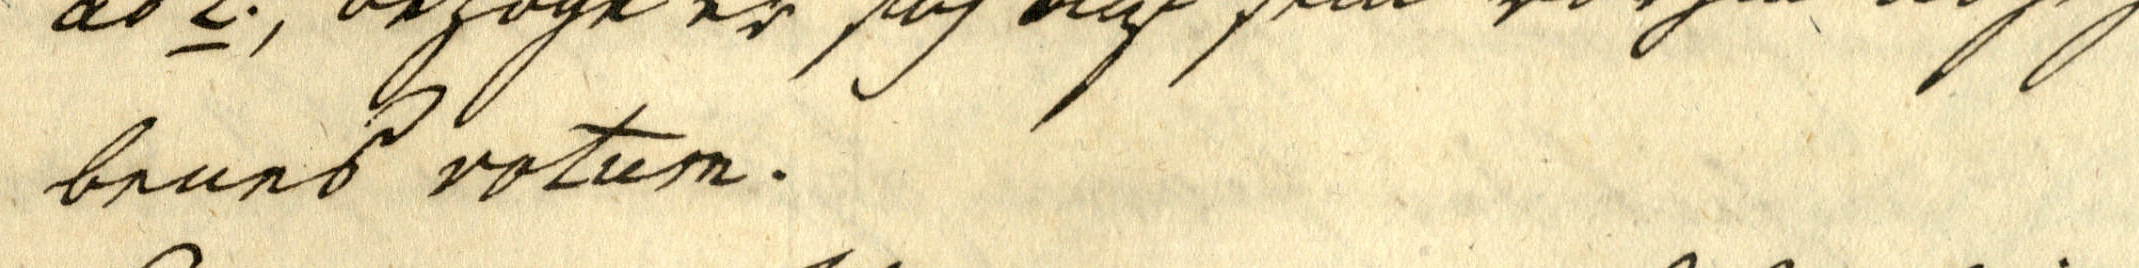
benes votum.
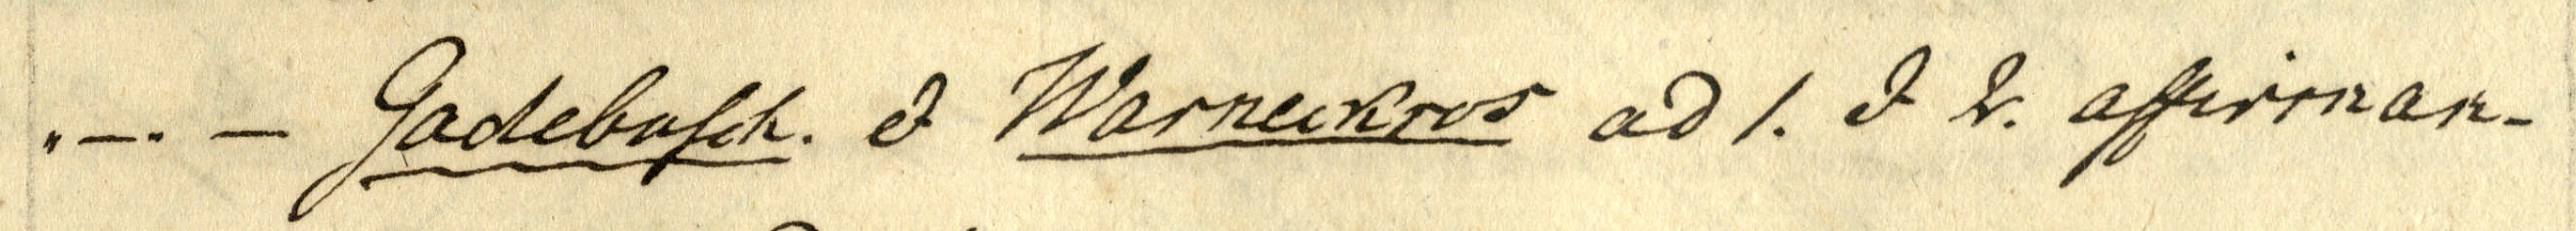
" - " - Gadebusch et Warneckros ad 1. et 2. affirman-
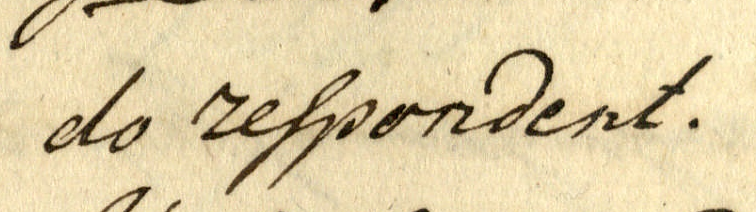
do respondent.
